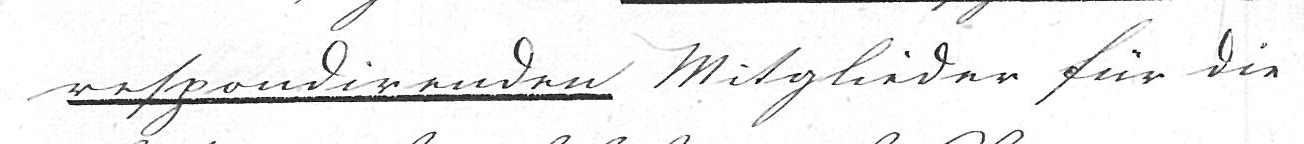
rospondirenden Mitglieder für die
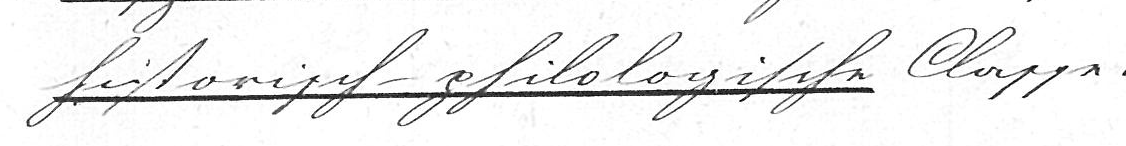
historisch-philologische Classe
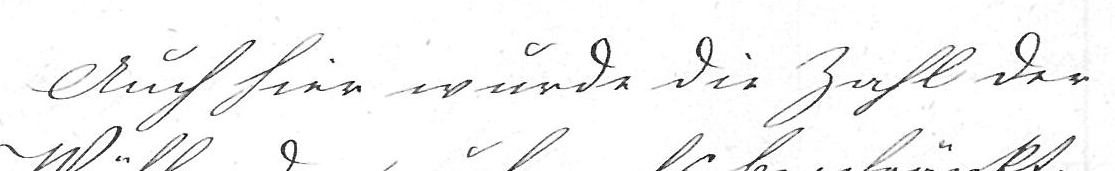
Auf hier wurde die Zahl der
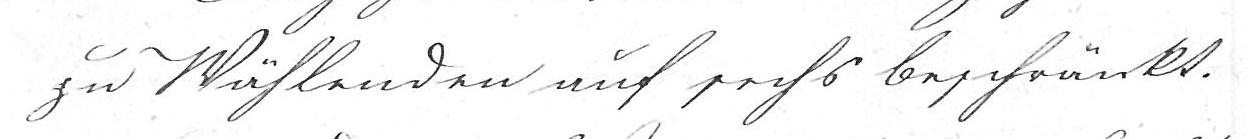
zu Wählenden auf sechs beschränkt.
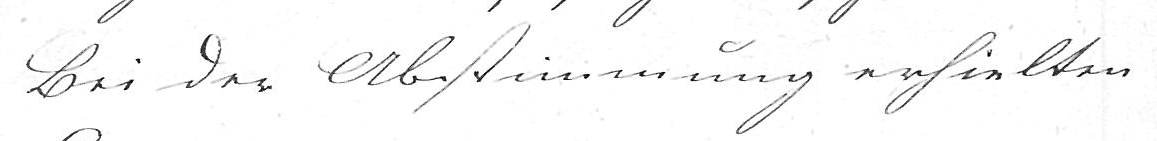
Bei der Abstimmung erhielten
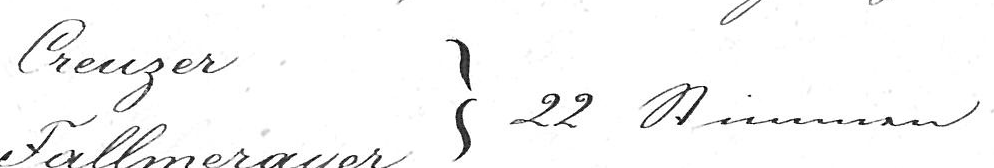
Creuzer 22 Stimmen
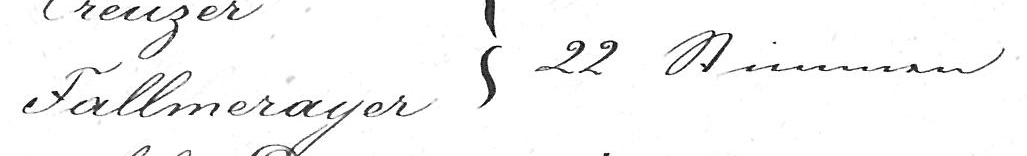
Fallmerayer 22 Stimmen
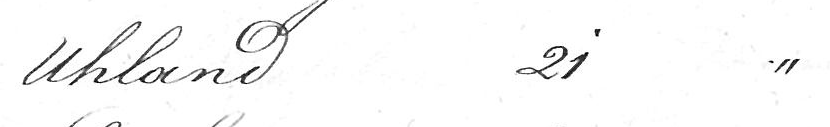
Uhland 2 "
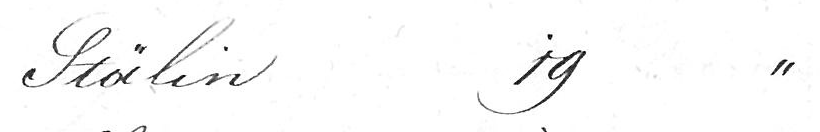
Stälin 19 "
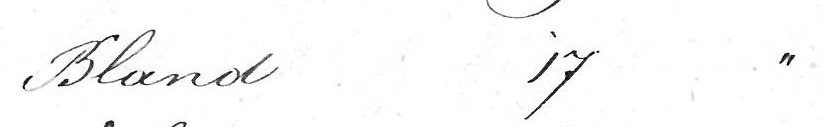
Bland 17 "
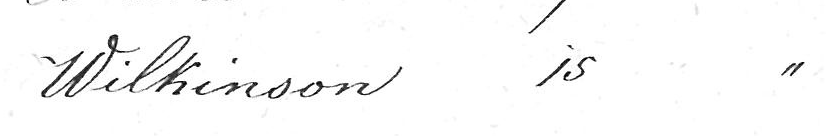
Wilkinson 15 "
